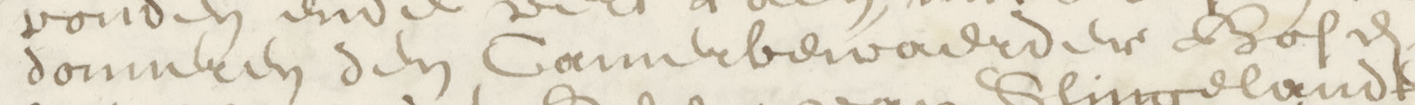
donneren den Camerbewaerder Bosch,
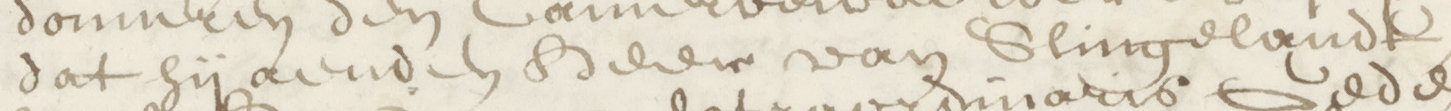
dat hij aenden Heer van Slingelandt,
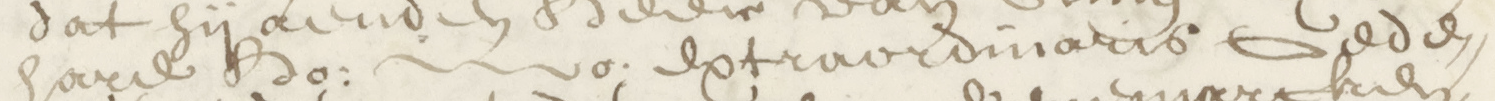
hare Ho:Mo: extraordinaris Gede„
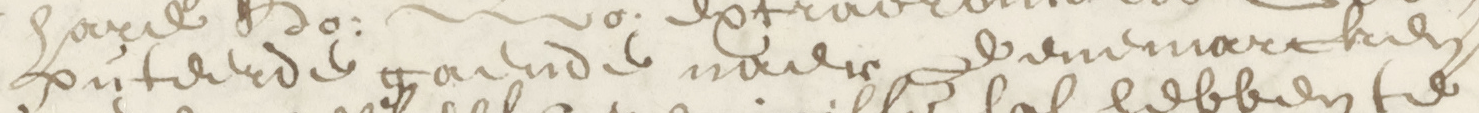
puteerde gaende naer Denemarcken,
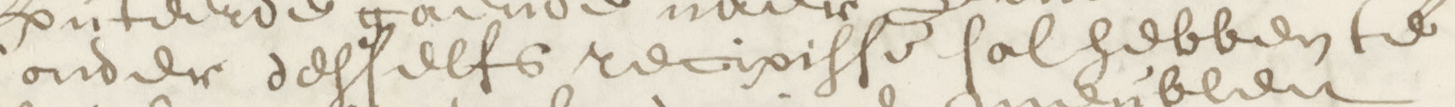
onder desselfs recipisse sal hebben te
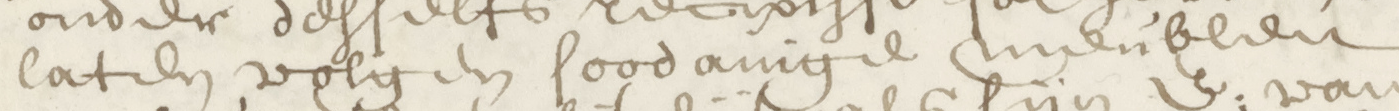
laten volgen soodanige meublen
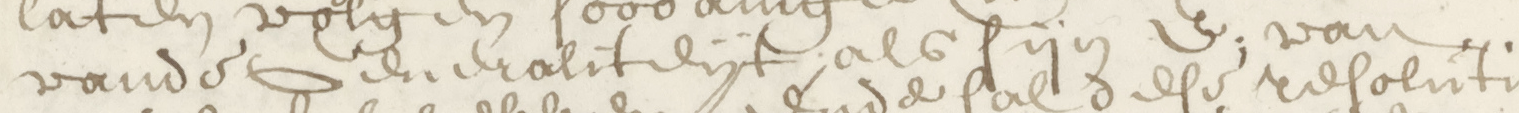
vande Generaliteijt als sijn E: van
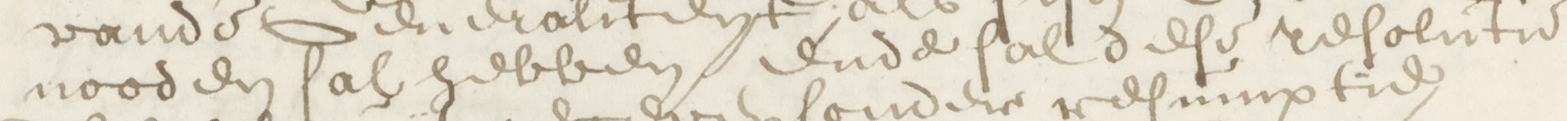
nooden sal hebben, ende sal dese resolutie
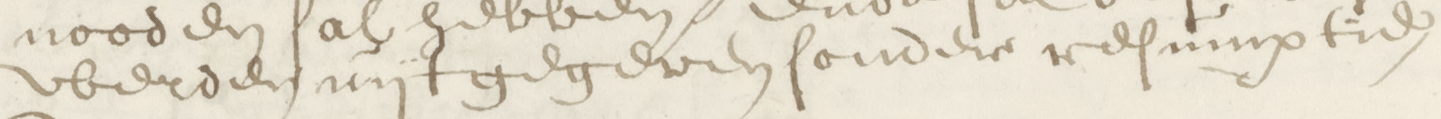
werden uijtgegeven sonder resumptie.
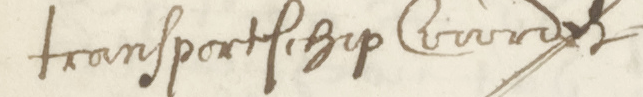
transportschip voorden
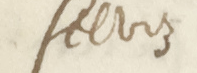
selven
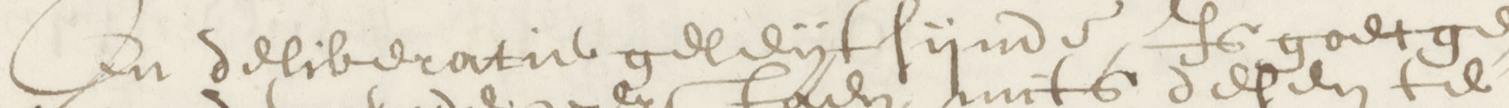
In deliberatie geleijt sijnde, Is goetge„
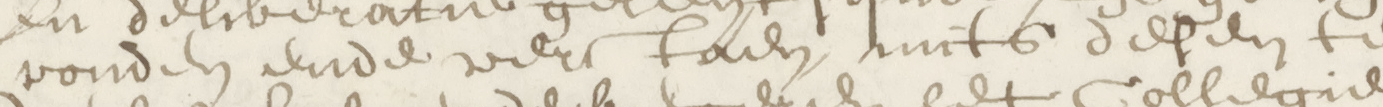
vonden ende verstaen, mits desen te
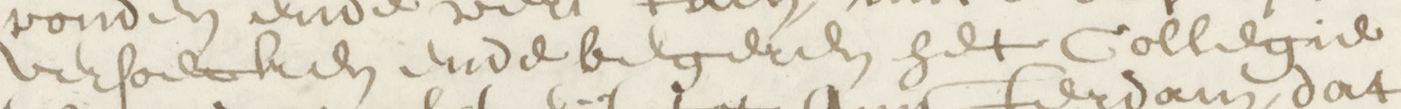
versoecken ende begeren het Collegie
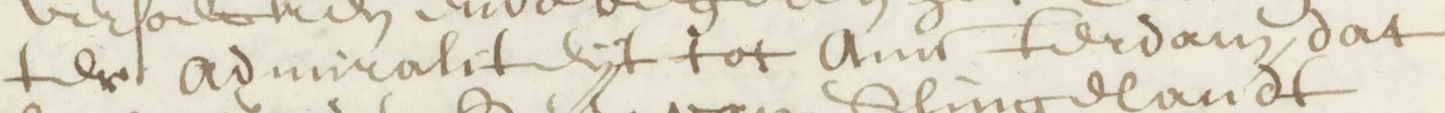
ter Admiraliteijt tot Amsterdam, dat
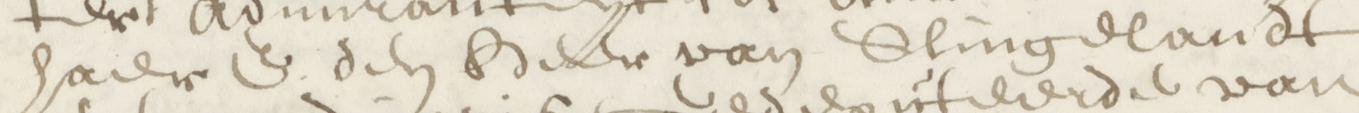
haer E. den Heer van Slingelandt
